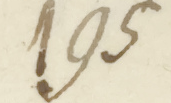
195
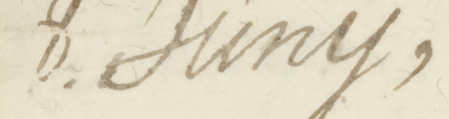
8 Junij
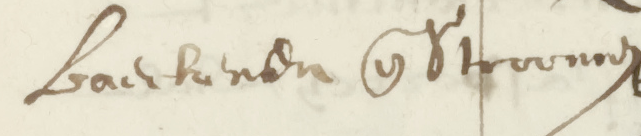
baeckenen & Stroomen
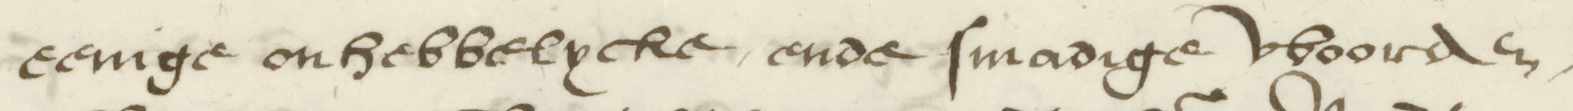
eenige onhebbelycke ende smadige woorden
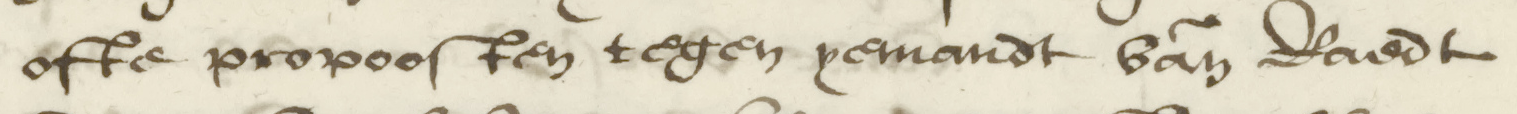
ofte propoosten tegen yemandt van Raedt
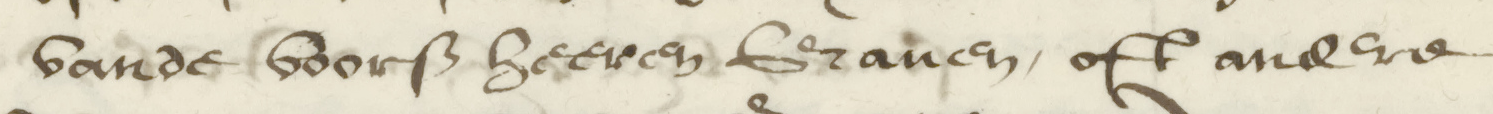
vande voors heeren Grauen, off andere
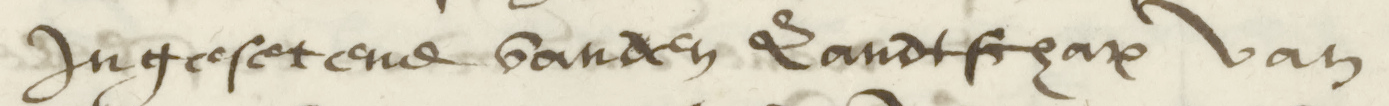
ingesetene vanden Landtschap van
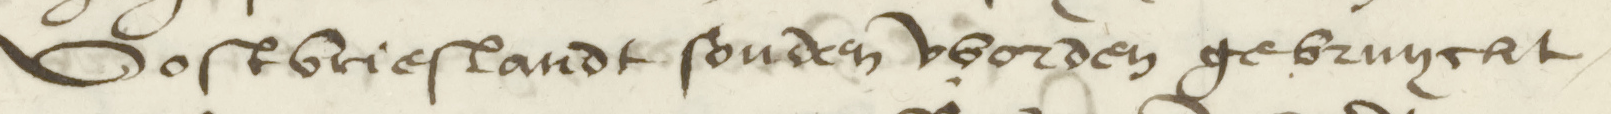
Oostvrieslandt souden worden gebruyckt
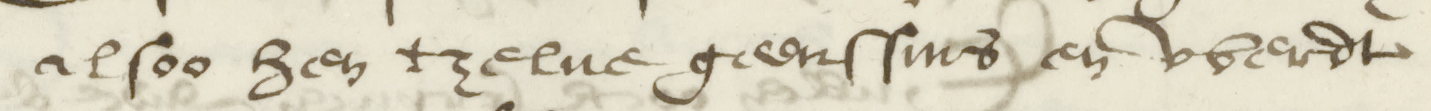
alsoo hen tzelue geenssins en werdt
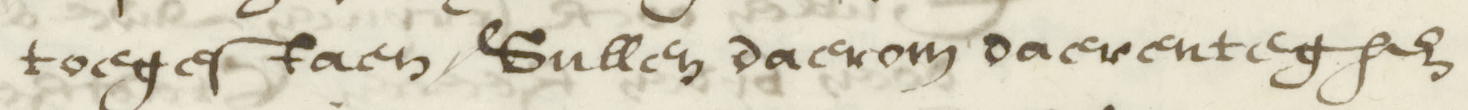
toegestaen. Sullen daerom daerenteghen
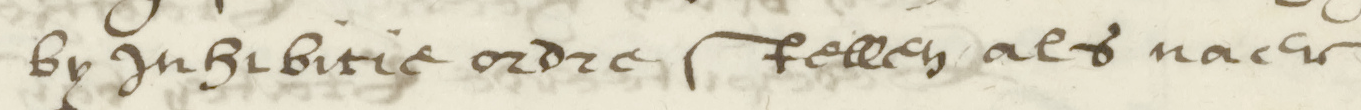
by inhibitie ordre stellen als naer
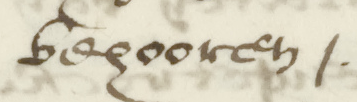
behooren.
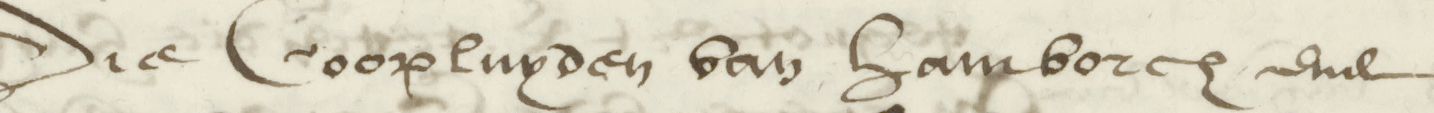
Die Coopluyden van Hamborch ende
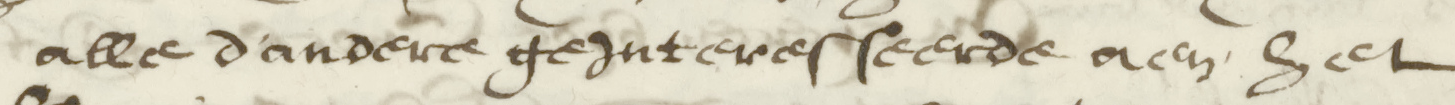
alle d'andere geinteresseerde aen het
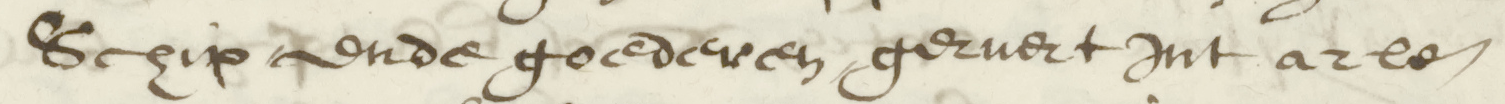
Schip ende goederen geruert int arle
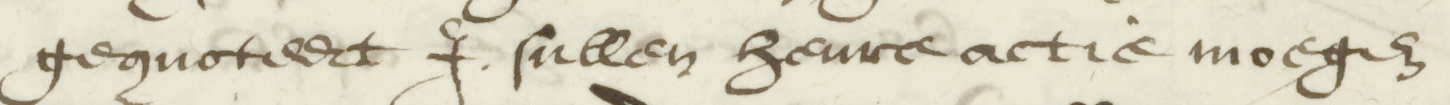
gequoteert J. sullen heure actie moegen
